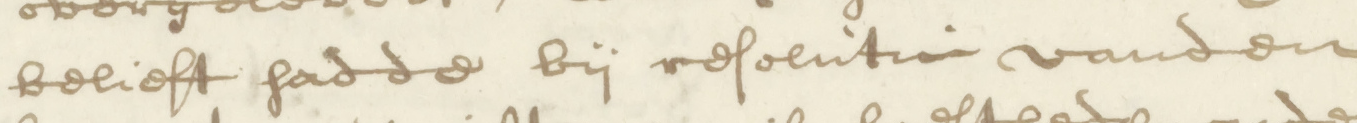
belieft hadde bij resolutie vanden
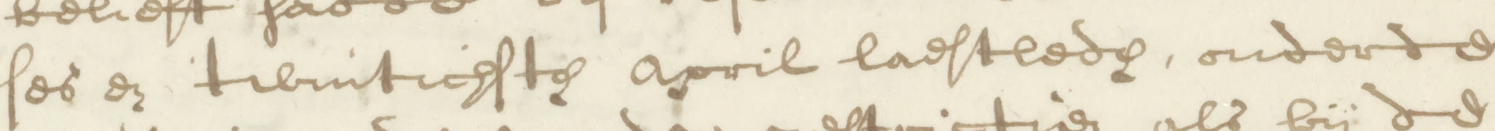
ses en twintichsten April laestleden, onder de
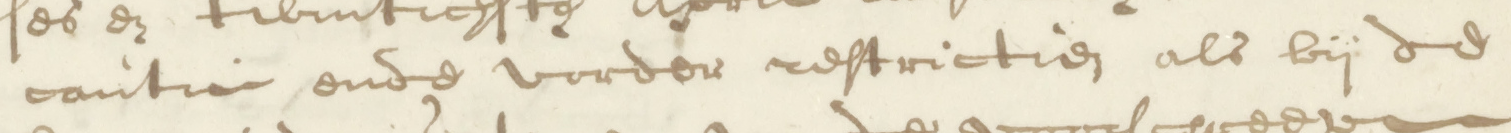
cautie ende vorder restrictien als bij de
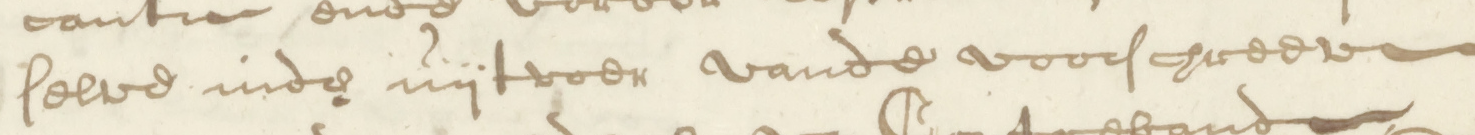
selve inden uijtvoer vande voorschreeve
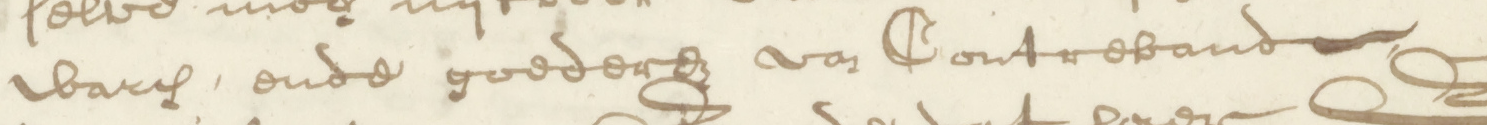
waren, ende goederen van Contrebande
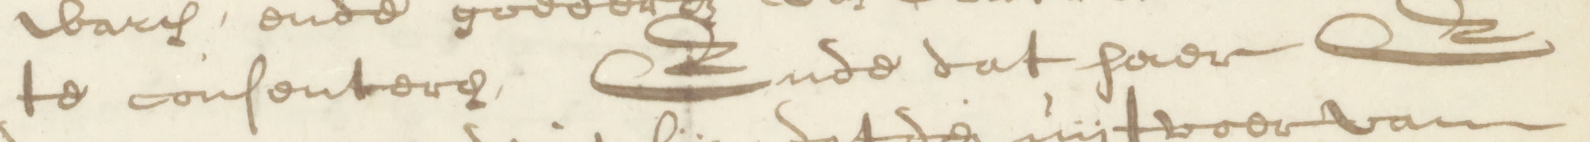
te consenteren. Ende dat haer E
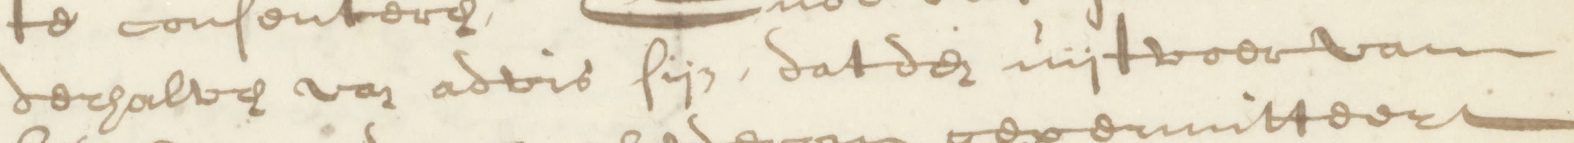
derhalven van advis sijn, dat den uijtvoer van
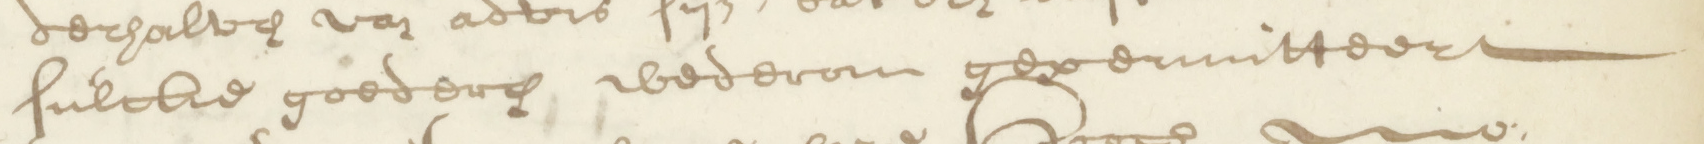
sulcke goederen wederom gepermitteert
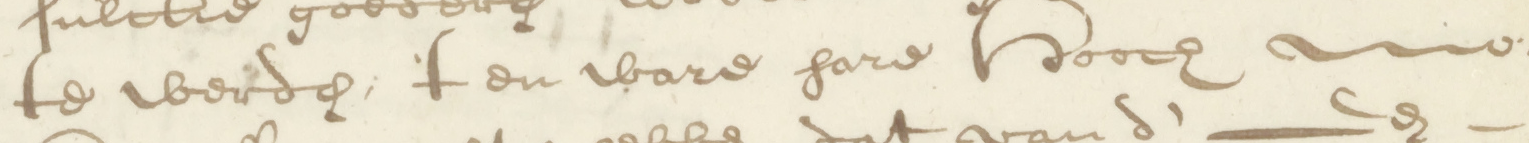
te werden; 't en ware hare Hooch Mo:
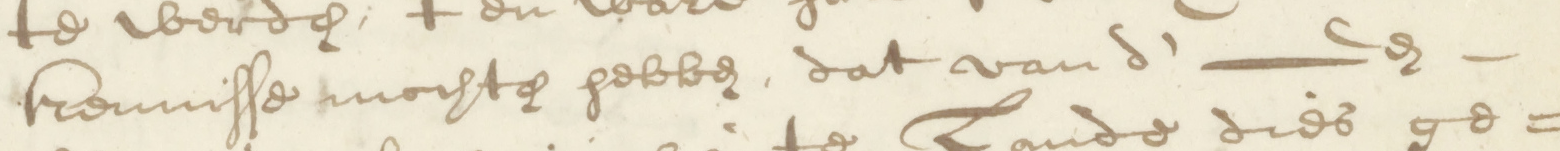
kennisse mochten hebben, dat van d‛ een —
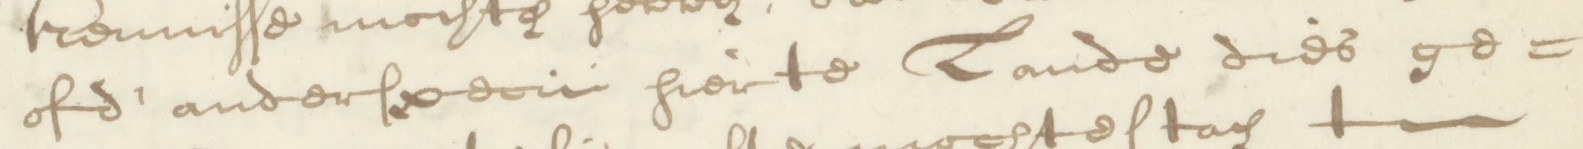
ofd' ander specie hier te Lande dies ge=
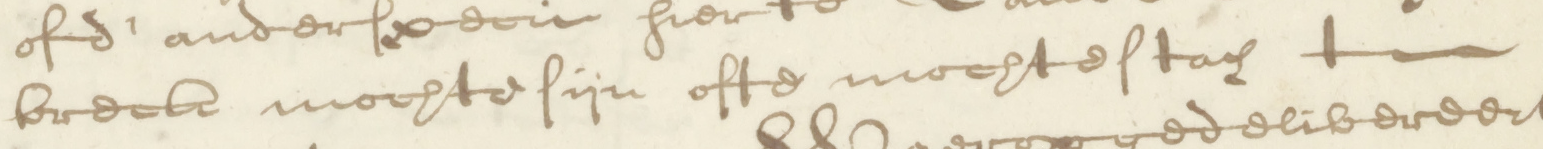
breck mochte sijn ofte mochte staen te
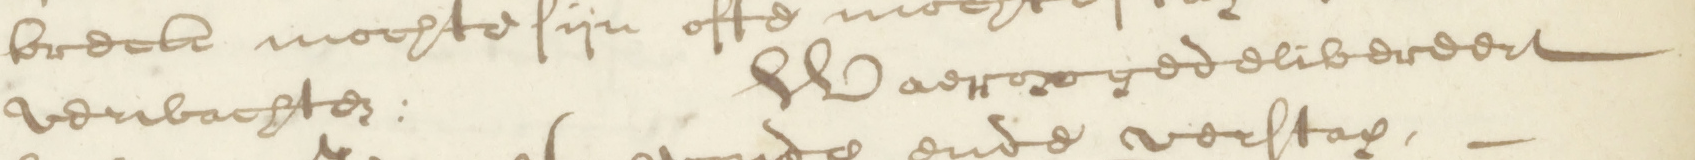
verwachten: Waerop gedelibereert
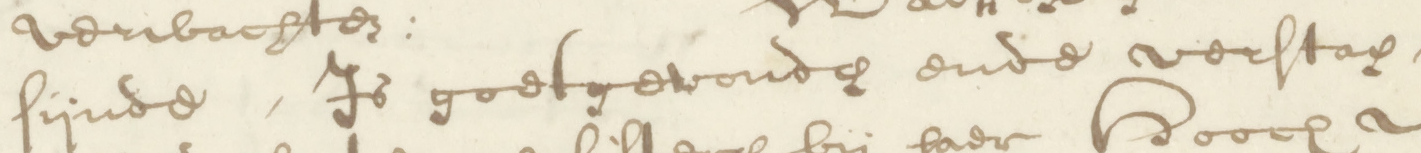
sijnde, Is goetgevonden ende verstaen,
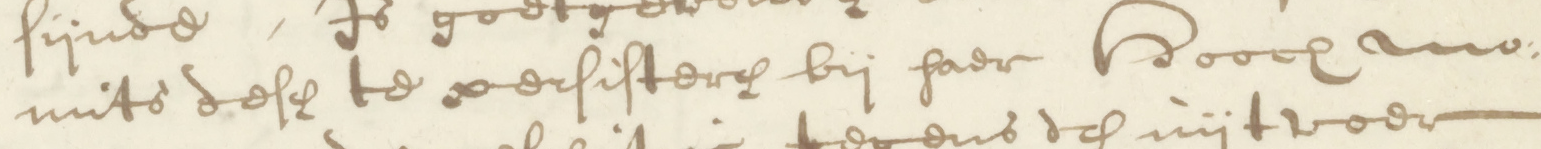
mits desen te persisteren bij haer Hooch Mo:
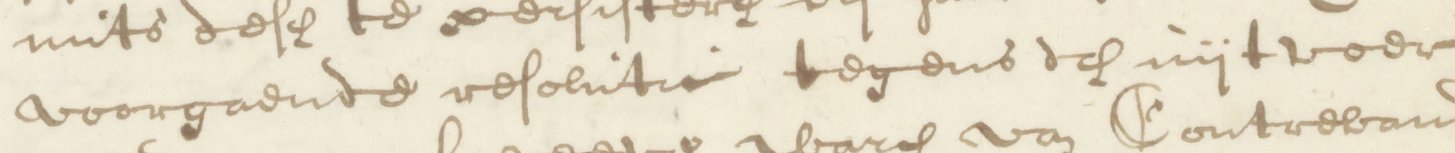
voorgaende resolutie tegens den uijtvoer
